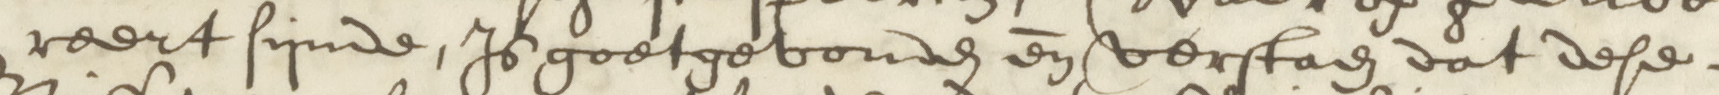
reert sijnde, Is goetgevonden en verstaen dat dese —
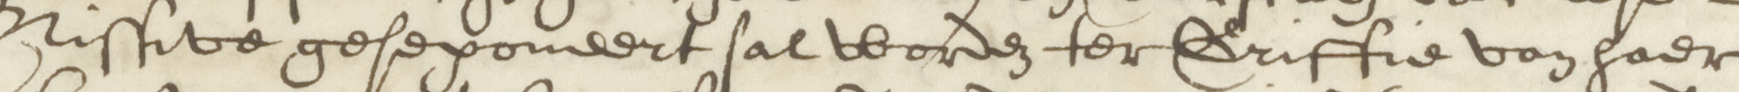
Missive geseponeert sal worden ter Griffie van haer
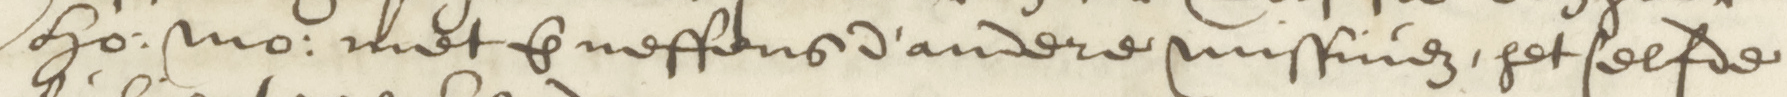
Ho:Mo: met & neffens d'andere missiven, het selfde
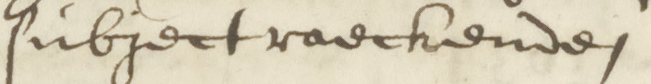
subject raeckende.
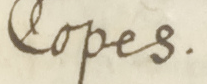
Copes.
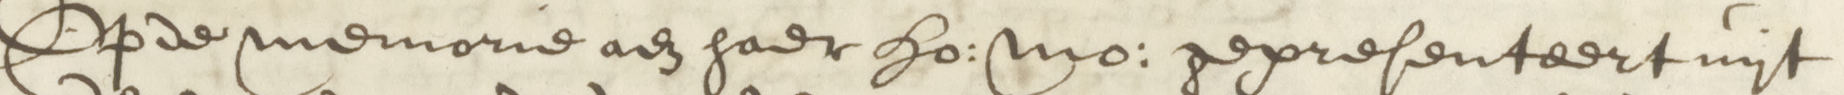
Opde memorie aen haer Ho:Mo: gepresenteert uijt
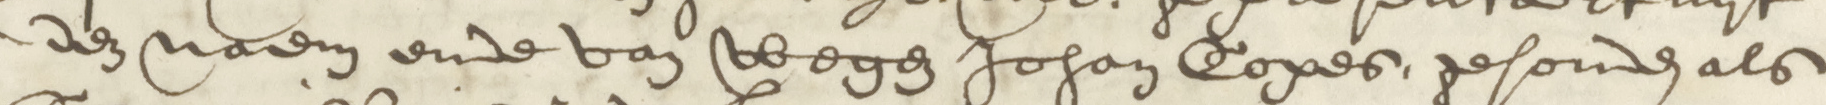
den naem ende van wegen Johan Copes, gesonden als
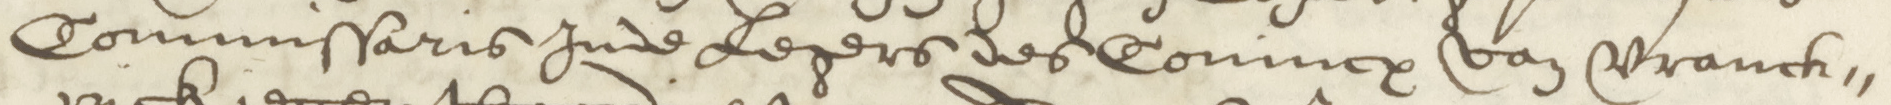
Commissaris Inde Legers des Conincx van Vranck„
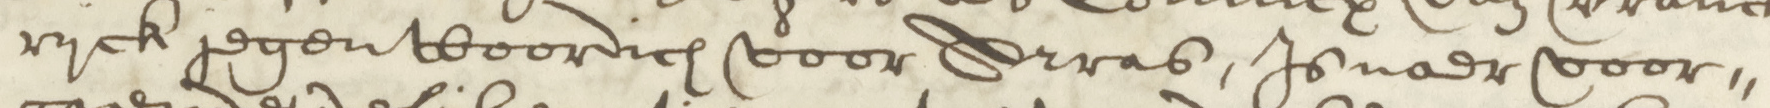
rijck jegenwoordich voor Arras, Is naer voor„
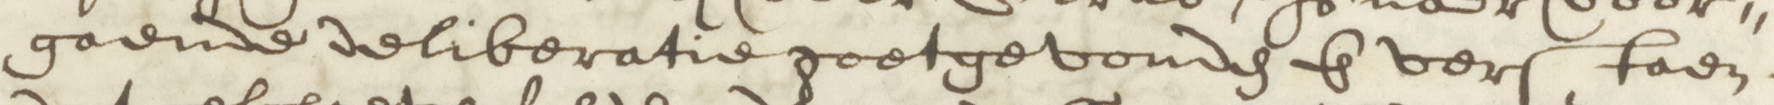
gaende deliberatie goetgevonden & verstaen -
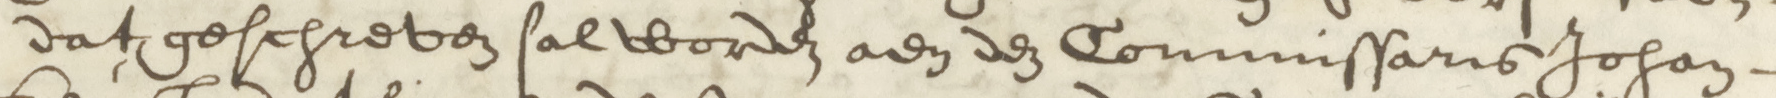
dat geschreven sal worden aen den Commissaris Johan —
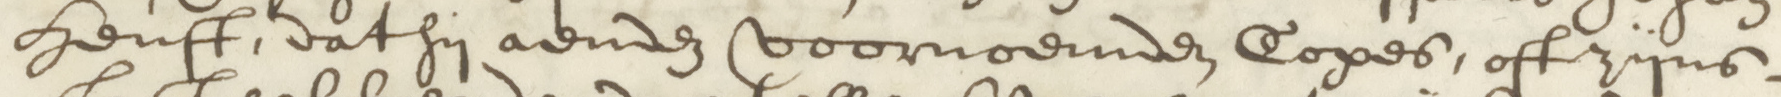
Heuft, dat hij aenden voornoemden Copes, oft zijns —-
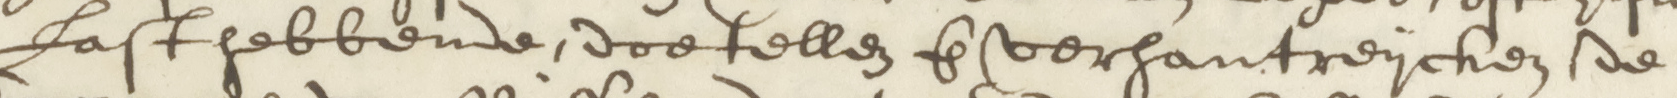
Lasthebbende, doe tellen & verhantreijcken de —
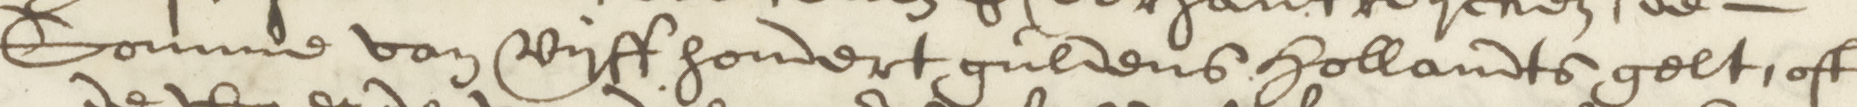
Somme van vijff hondert guldens Hollandts gelt, oft
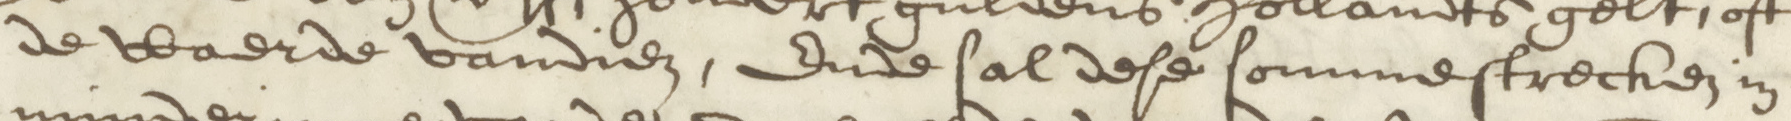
de waerde vandien, Ende sal dese somme strecken in
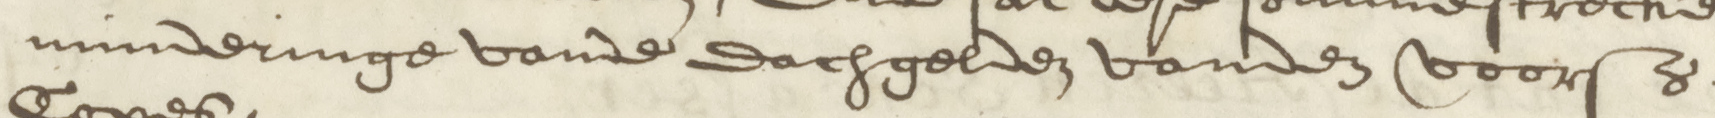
minderinge vande Dachgelden vanden voorss. —
